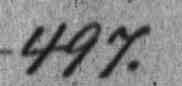497.
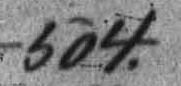504.
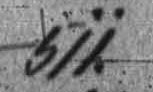511.
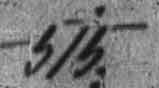515.
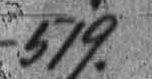519.
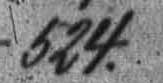524.
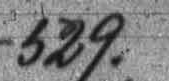529.
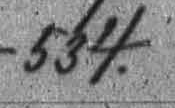534.
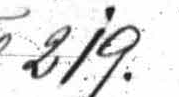219.
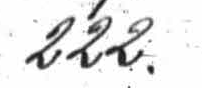222.
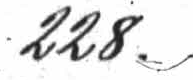228.
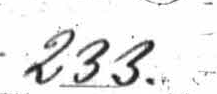233.
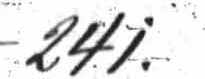241.
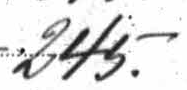245.
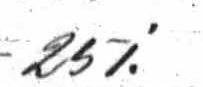251.
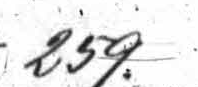259.
